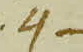4
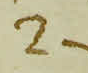2
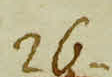26
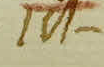18
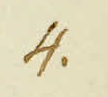4.
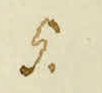5.
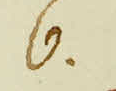6.
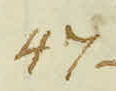47
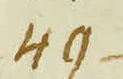49
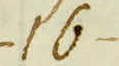16
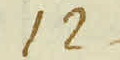12
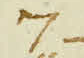7
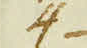4
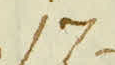17
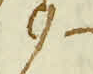9
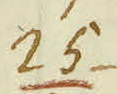25
